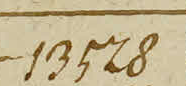13528
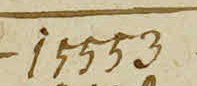15553
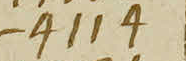4114
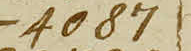4087
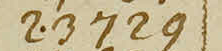23729
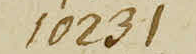10231
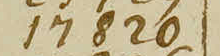17820
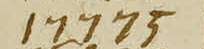17775
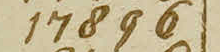17896
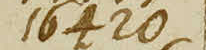16420
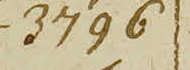3796
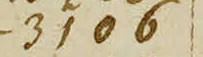3106
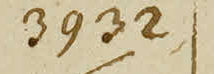3932
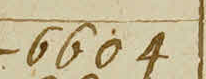6604
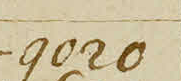9020
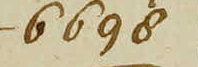6698
